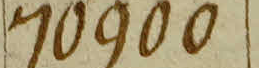70900
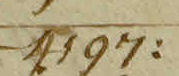4197
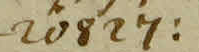20827
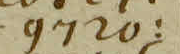9720
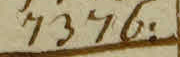7376
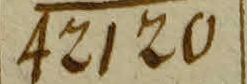42120
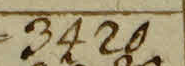3420
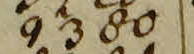9380
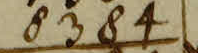8384
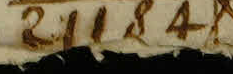21184
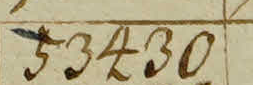53430
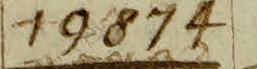19874
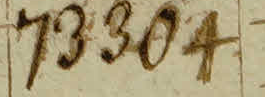73304
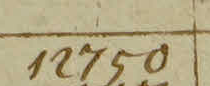12750
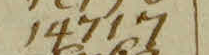14717
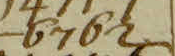6762
